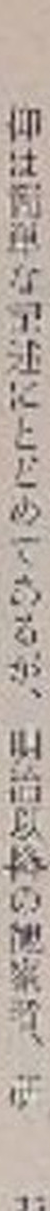仰は簡単な記述にとどめてあるが、明治以降の視察者、研
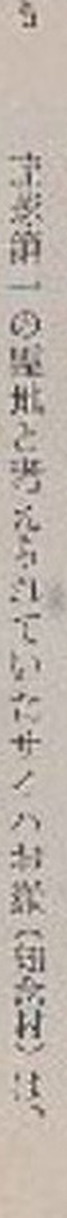琉球第一の霊地と考えられていたサイハお嶽(知念村)は、
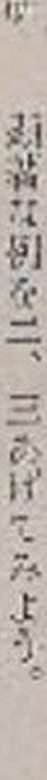顕著な例を二、三あげてみよう。
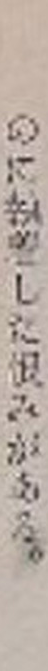のに執着した恨みがある。
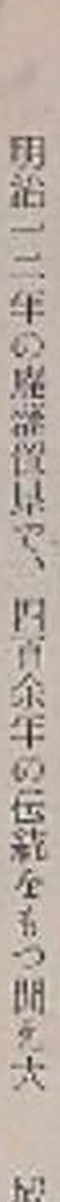明治一二年の廃藩置県で、四百余年の伝統をもつ聞え大
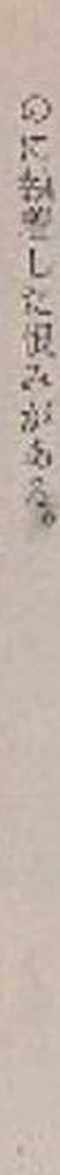のに執着した恨みがある。
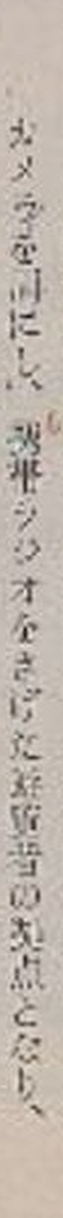カメラを肩にし、携帯ラジオをさげた遊覧者の拠点となり、
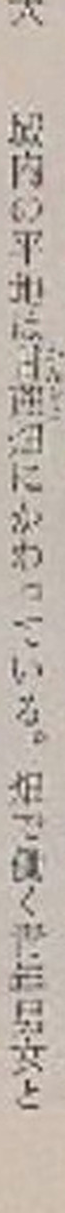城内の平地は甘藷畑にかわっている。畑で働く青年男女と
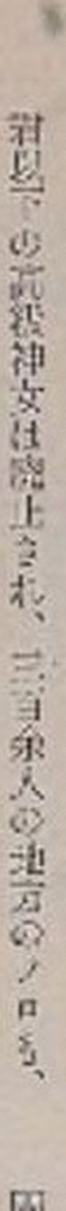君以下の高級神女は廃止され、三百余人の地方のノロも、
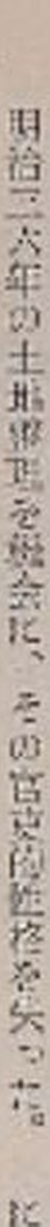明治二六年の土地整理を機会に、その官吏的性格を失った。
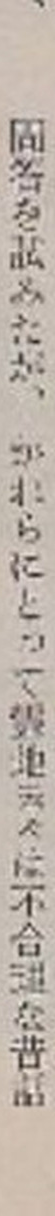問答を試みたが、かれらにとって霊地云々は不合理な昔話
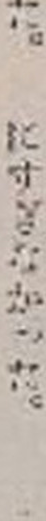にすぎなかった。
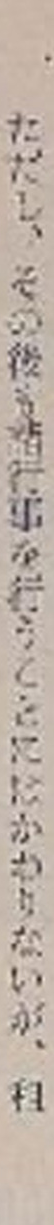ただし、その後も諸行事を行うことにはかわりないが、租
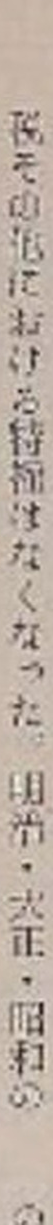税その他における特権はなくなった。明治・大正・昭和の
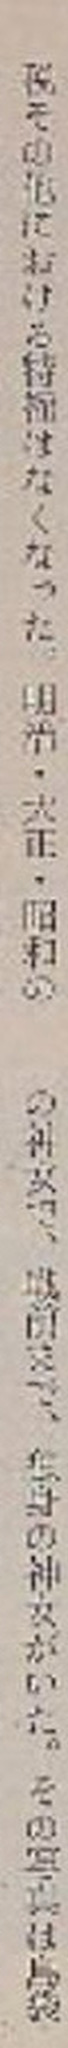税その他における特権はなくなった。明治・大正・昭和の
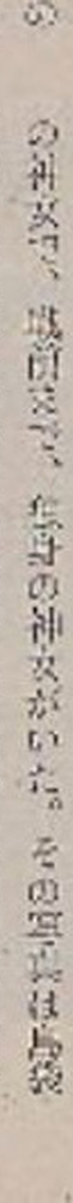の神女で、戦前まで、独身の神女がいた。その写真は島袋
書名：沖縄固有信仰のおとろえ
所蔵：University of the Ryukyus Library
